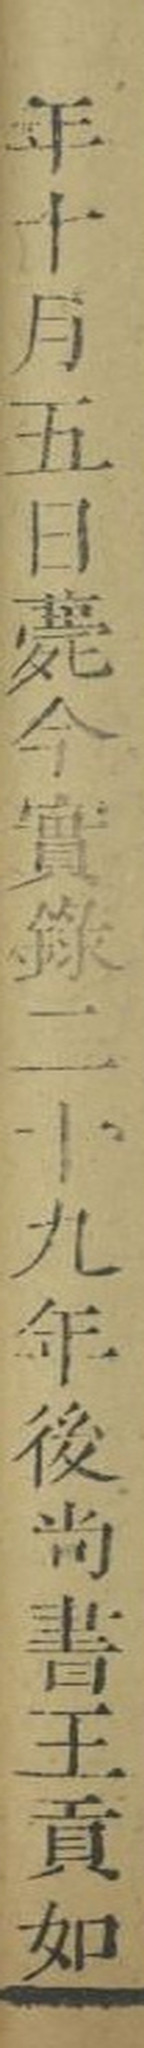年十月五日薨今実録二十九年後尚書王貢如
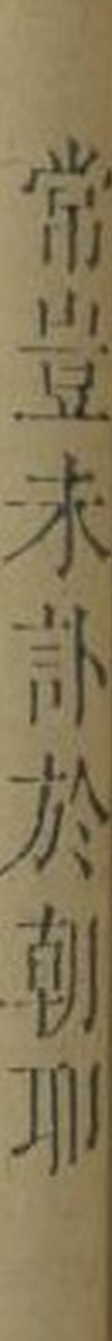常豈未訃於朝耶
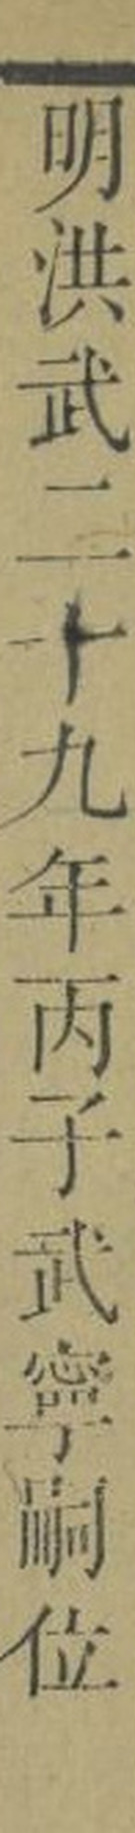明洪武二十九年丙子武寧嗣位
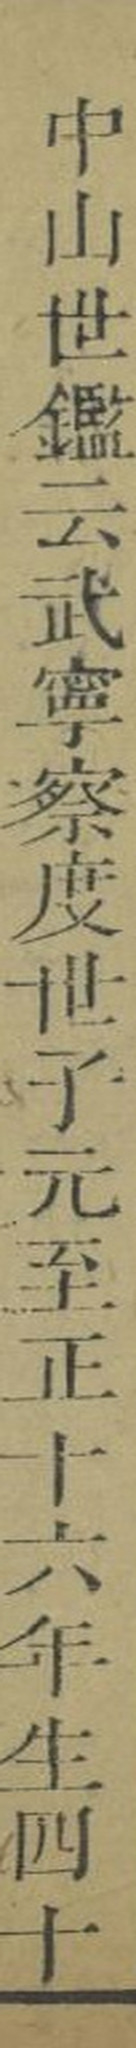中山世鑑云武寧察度世子元至正十六年生四十
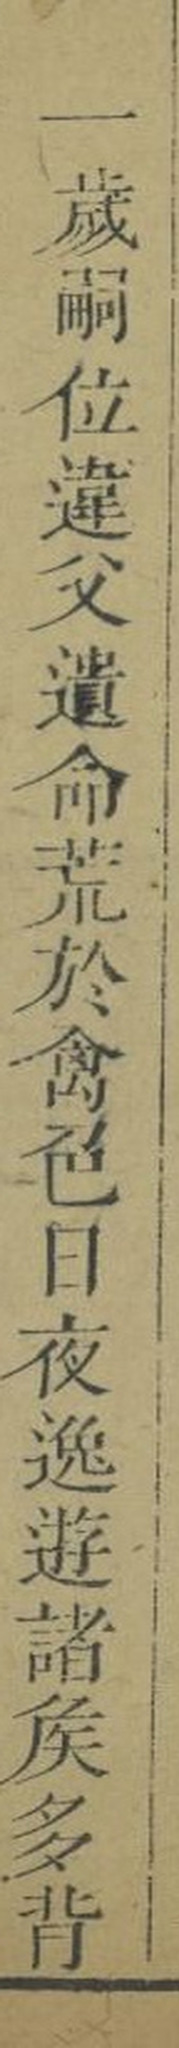一歳嗣位違父遺命荒於禽色日夜逸遊諸侯多背
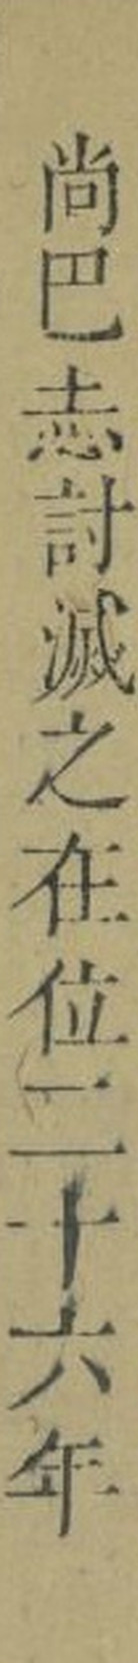尚巴志討滅之在位二十六年
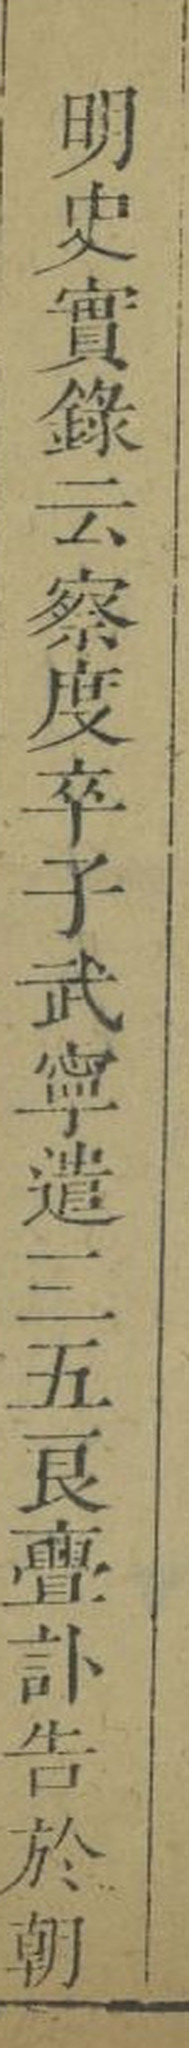明史実録云察度卒子武寧遣三五良亹訃告於朝
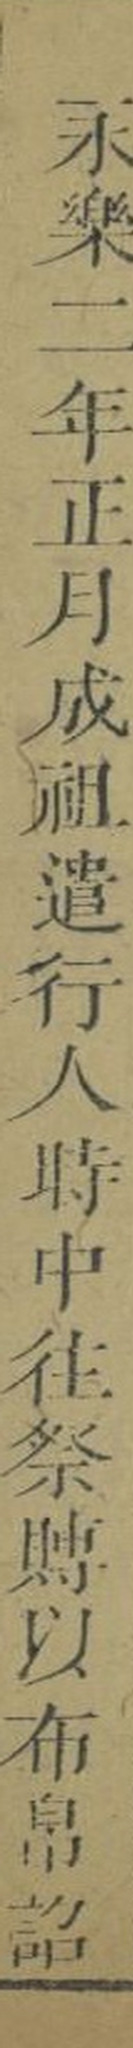永楽二年正月成祖遣行人時中往祭賻以布帛詔
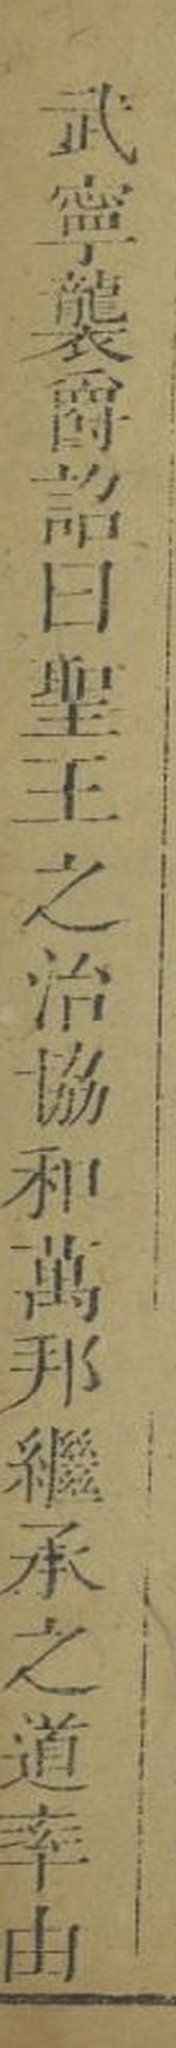武寧襲爵詔曰聖王之治協和万邦継承之道率由

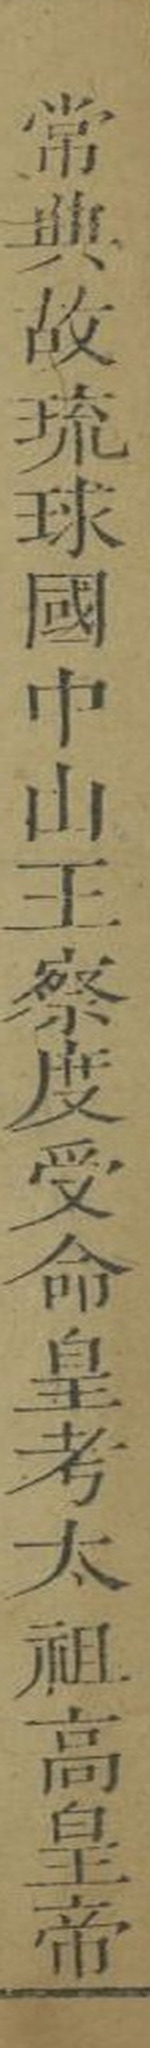常典故琉球国中山王察度受命皇考太祖高皇帝
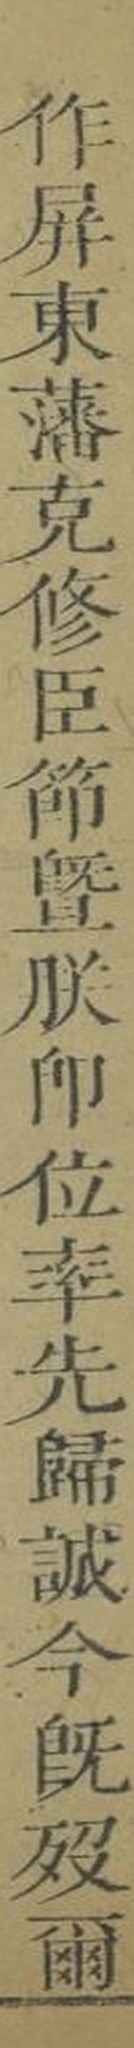作屏東藩克修臣節曁朕即位率先帰誠今既歿爾
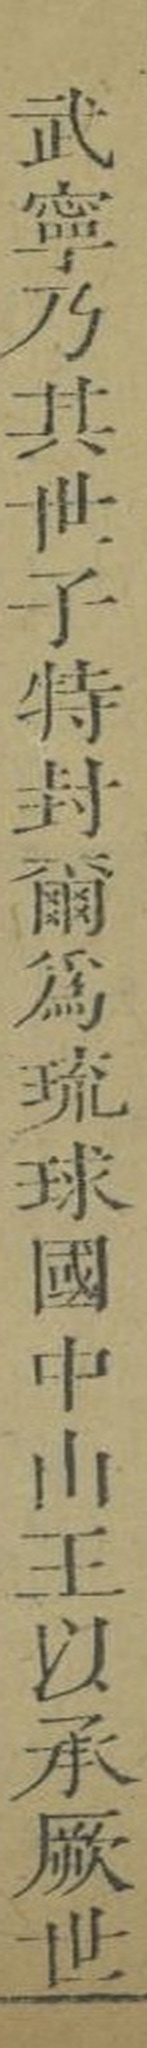武寧乃其世子特封爾為琉球国中山王以承厥世
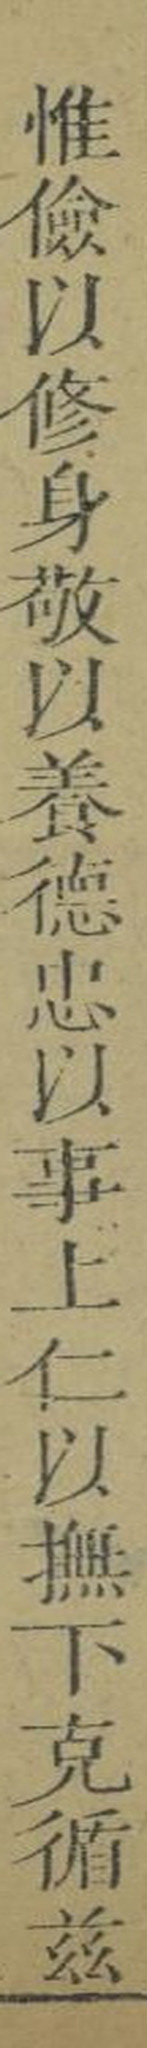惟倹以修身敬以養徳忠以事上仁以撫下克循茲
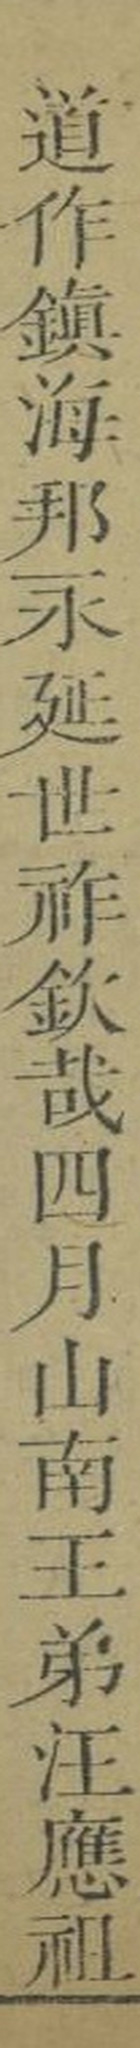道作鎮海邦永延世祚欽哉四月山南王弟汪応祖
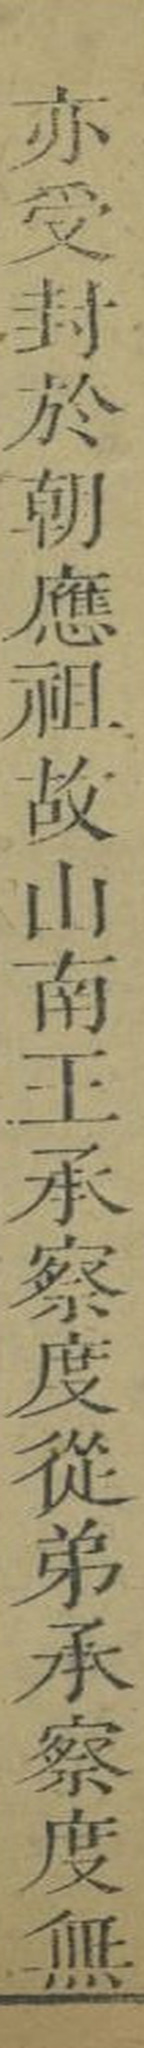亦受封於朝応祖故山南王承察度従弟承察度無
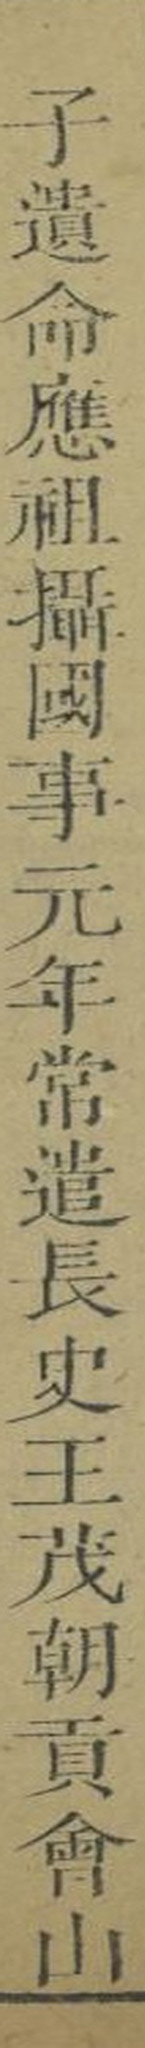子遺命応祖摂国事元年常遣長史王茂朝貢会山
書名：中山伝信録 巻三
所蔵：University of the Ryukyus Library
